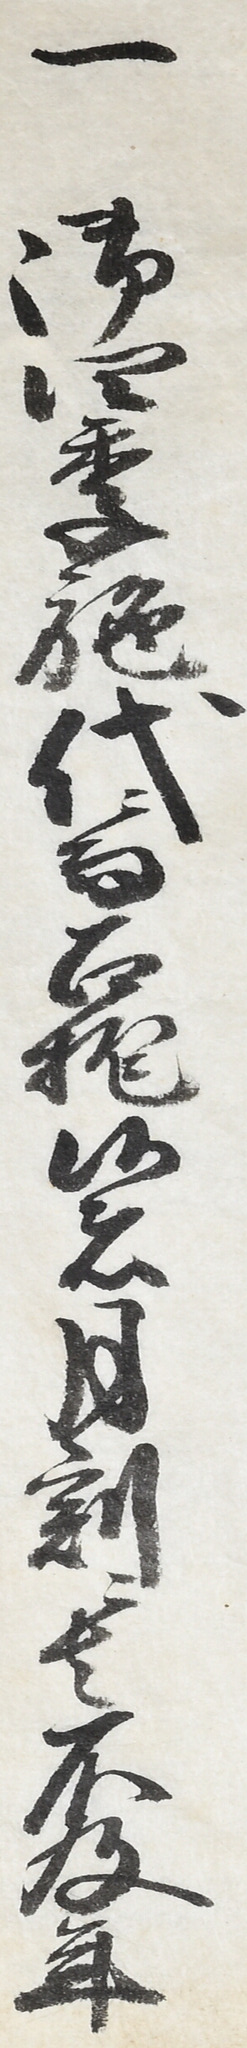一御四季施代ニ而召抱候は月割ニは不及年
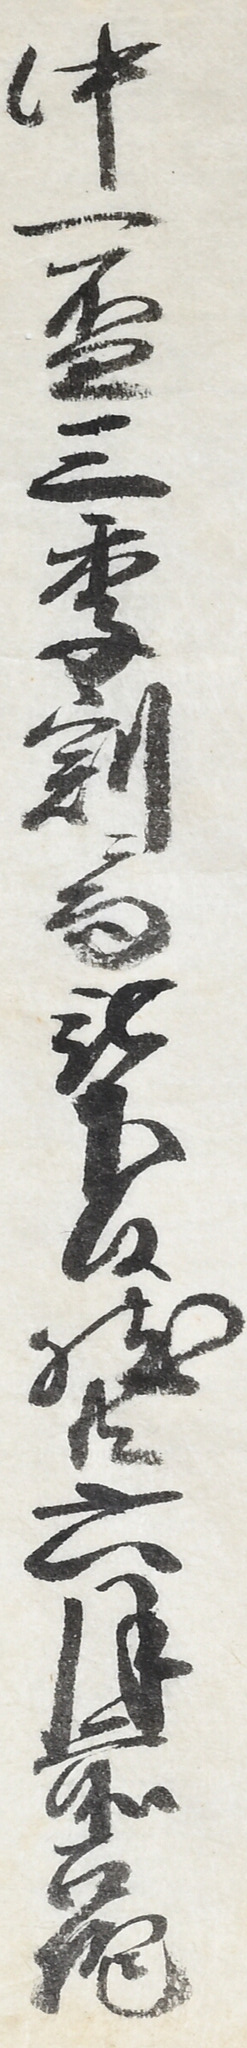中一盃三季割ニ而被下候然共六月前召抱

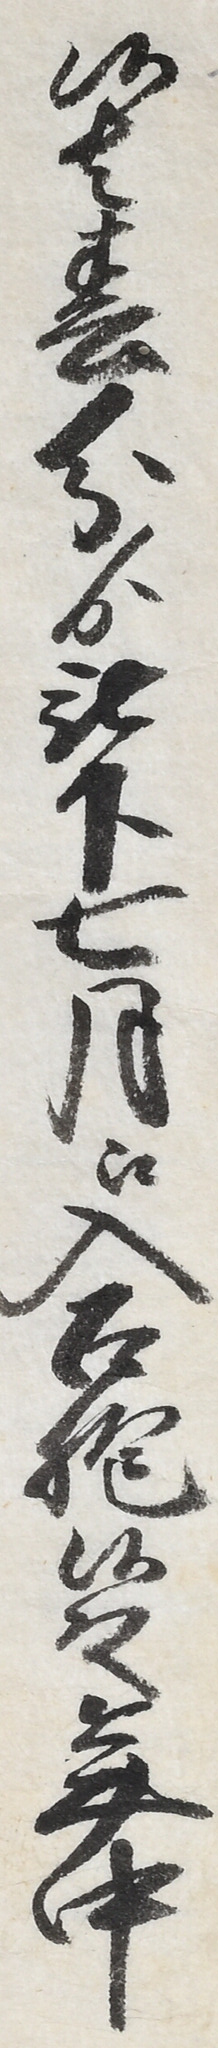候は春分ゟ被下七月江入召抱候ハヽ年中
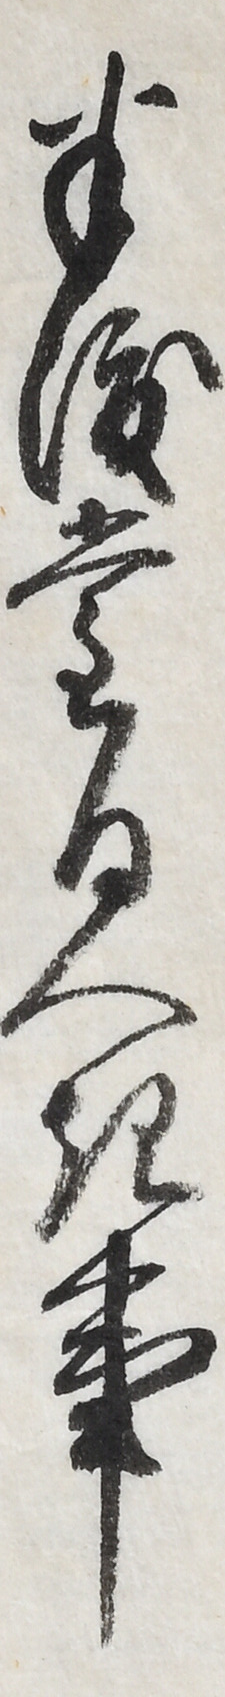半渡たるへき事
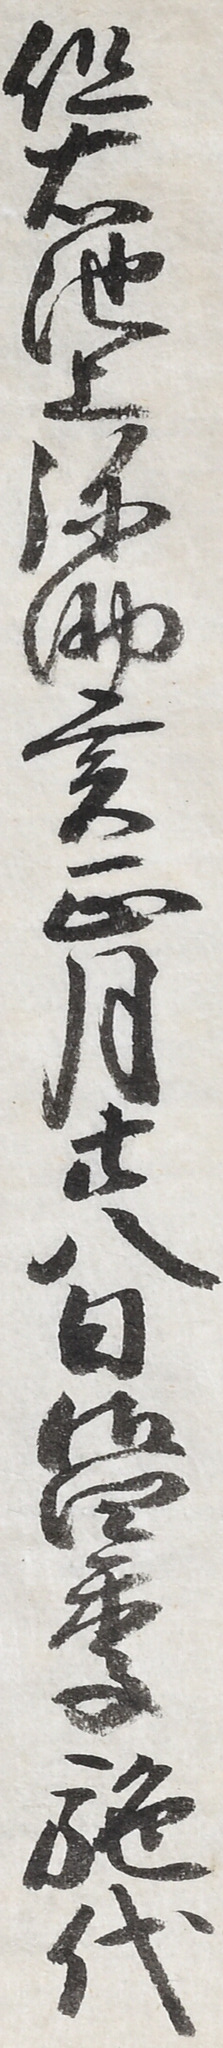但右池上弥助亥正月廿八日御四季施代
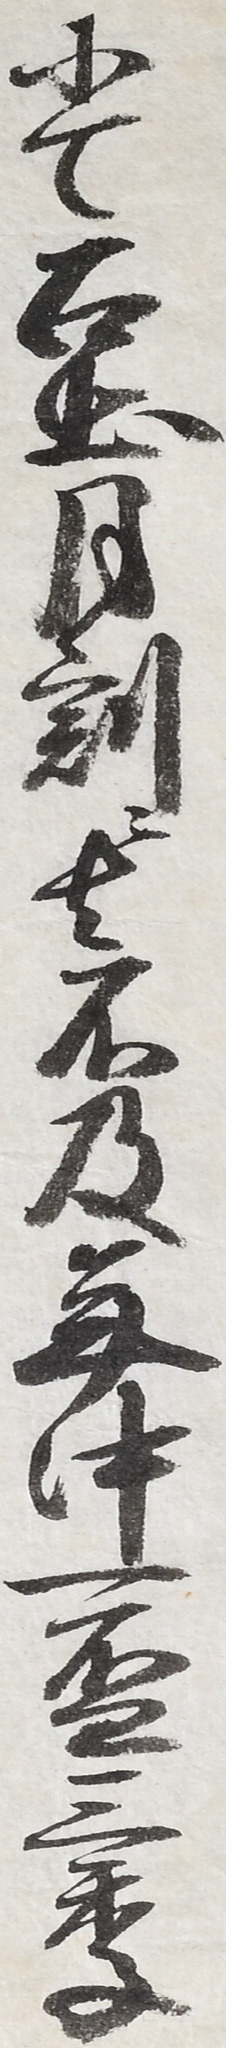にて召出月割ニは不及年中一盃三季
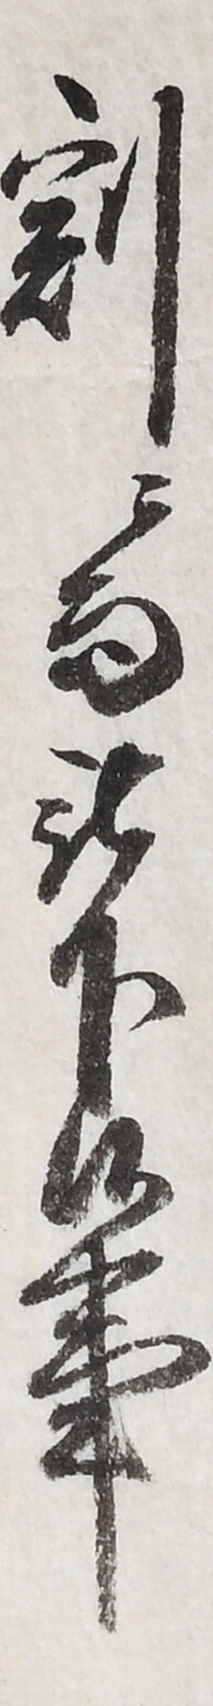割ニ而被下候事
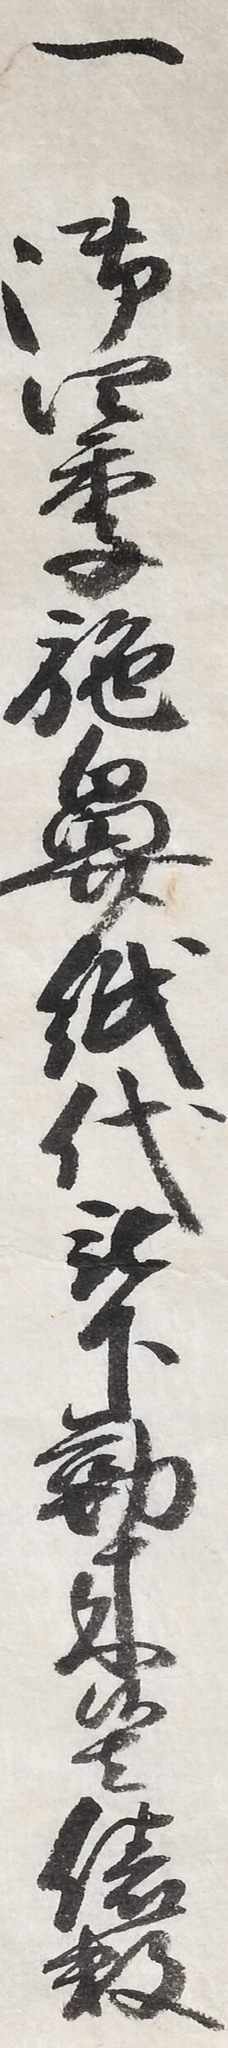一御四季施鼻紙代被下勤来候は俵数
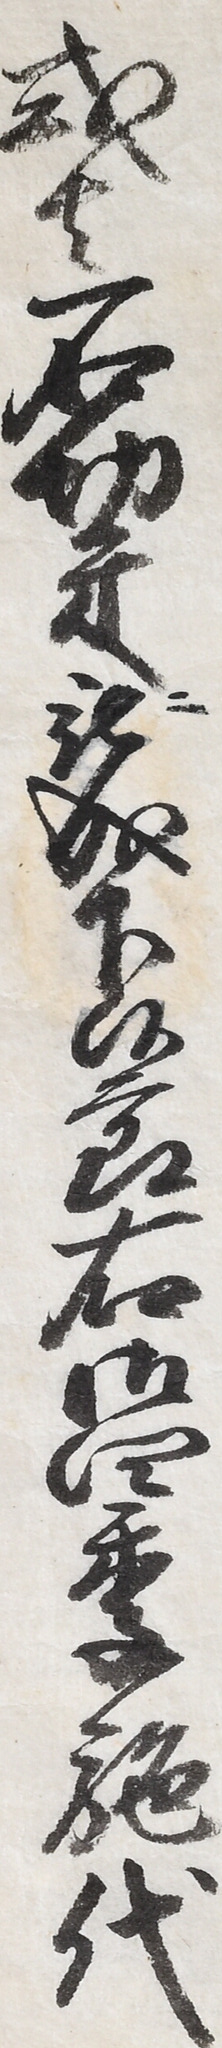或は石切米ニ被成下候節右御四季施代
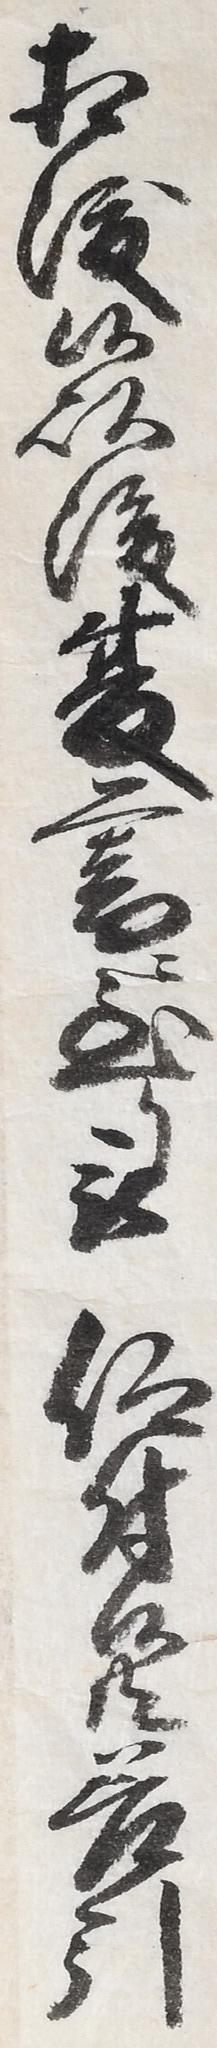相渡候以後夏暮ニ至リ被仰付候共差引
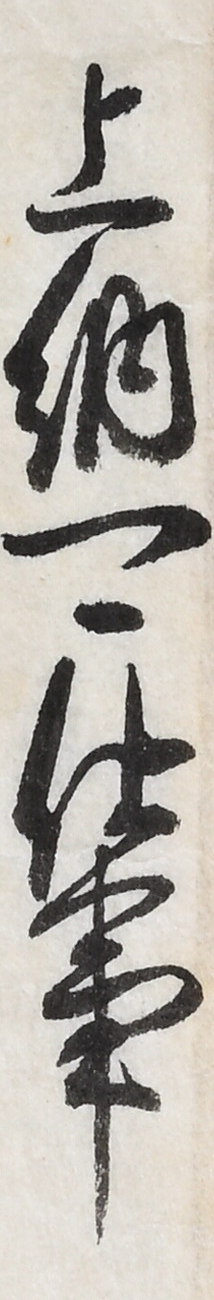上納可仕事
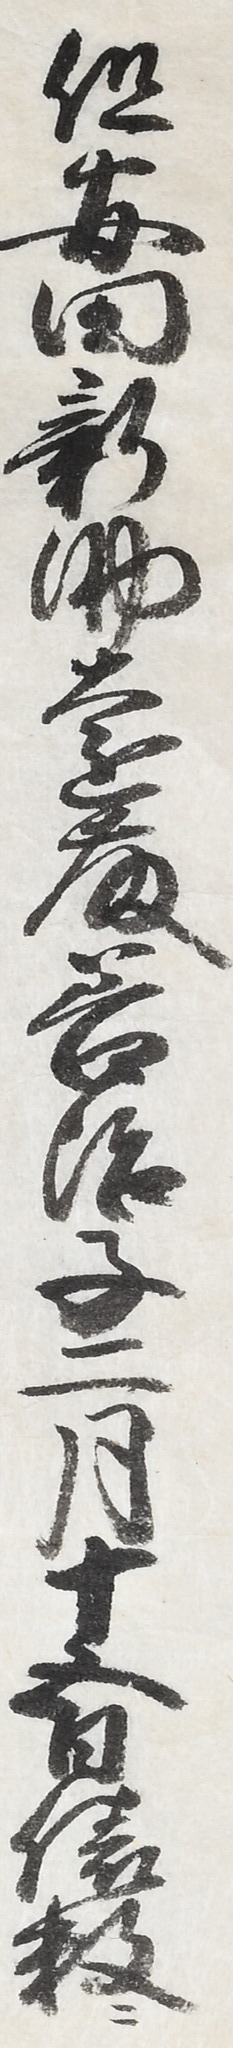但安田新助遠藤善治子二月十五日俵数ニ
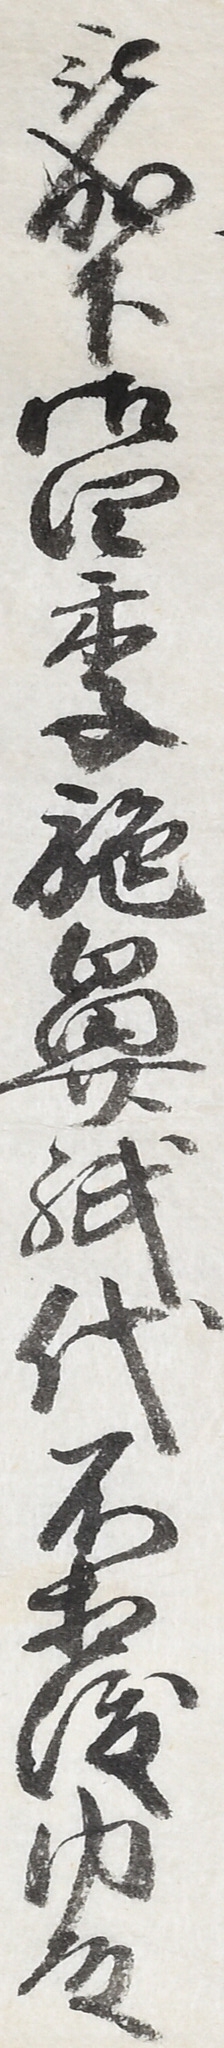被成下御四季施鼻紙代不相渡内藤
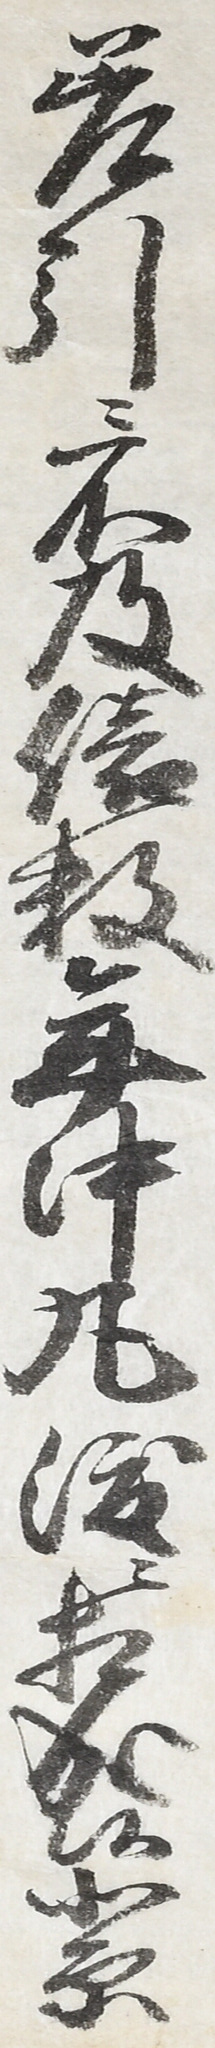差引ニ不及俵数年中丸渡ニ相成候北原
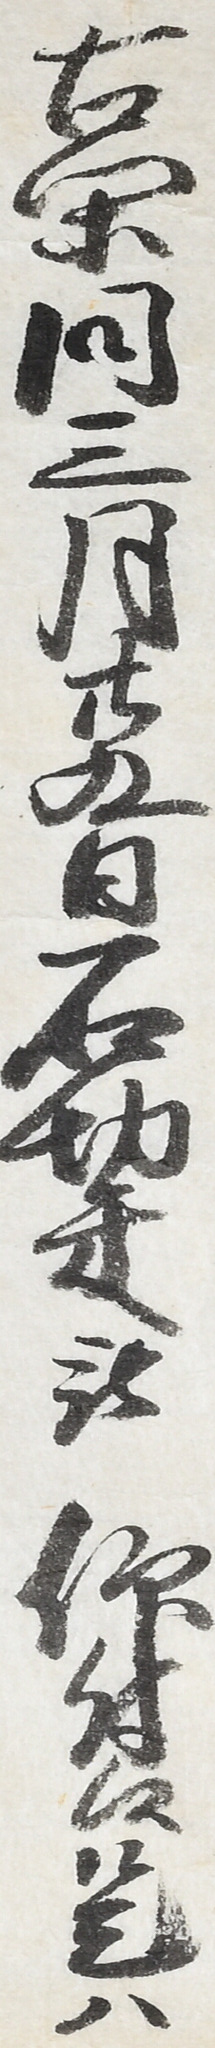古閑同三月廿九日石切米被仰付候是ハ
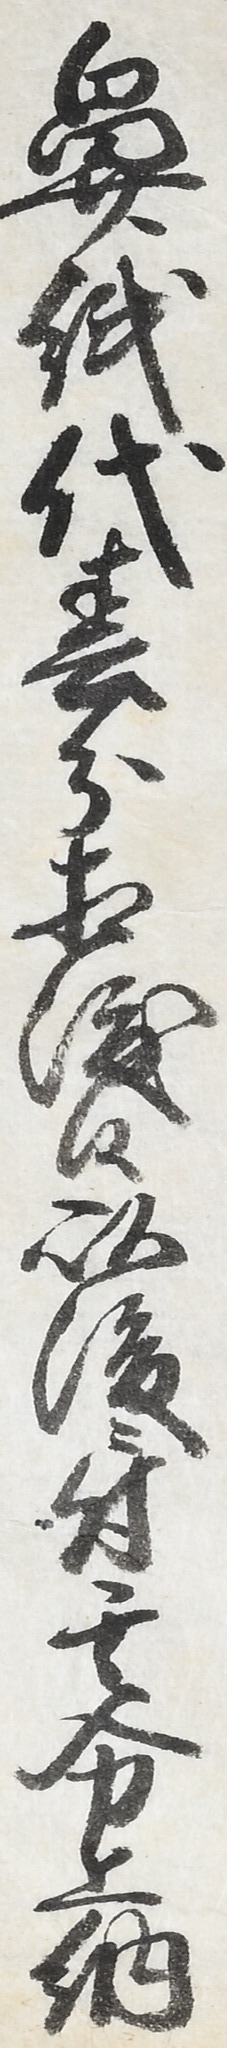鼻紙代春分相渡候以後ニ付其分上納
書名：御給分渡り方定追加
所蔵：伊那市立高遠町図書館・合同会社AMANE
